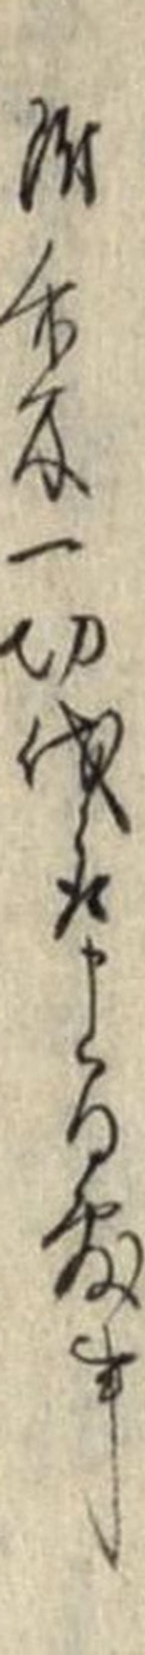附竹木一切伐取申間敷事
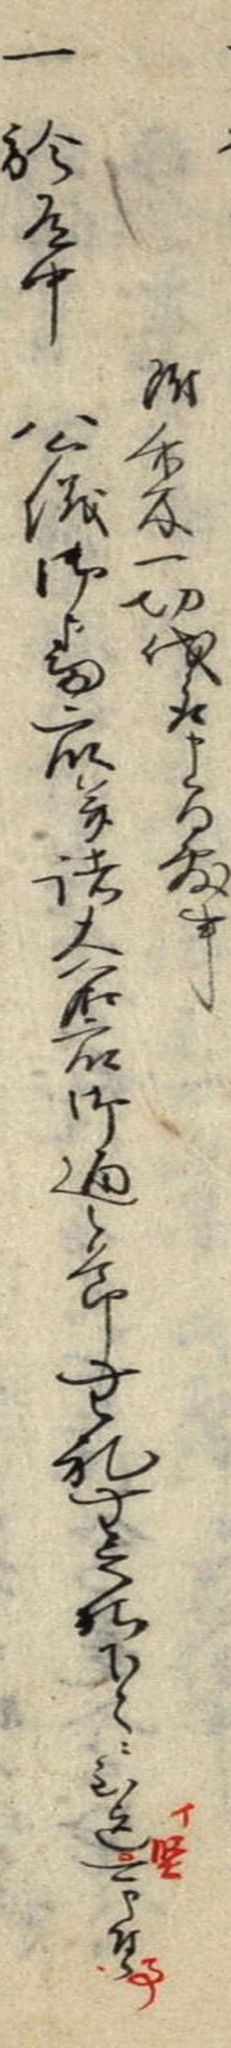一於道中公儀御番衆并諸大名衆御通之節無札無之様下々に至迄◦可申付候
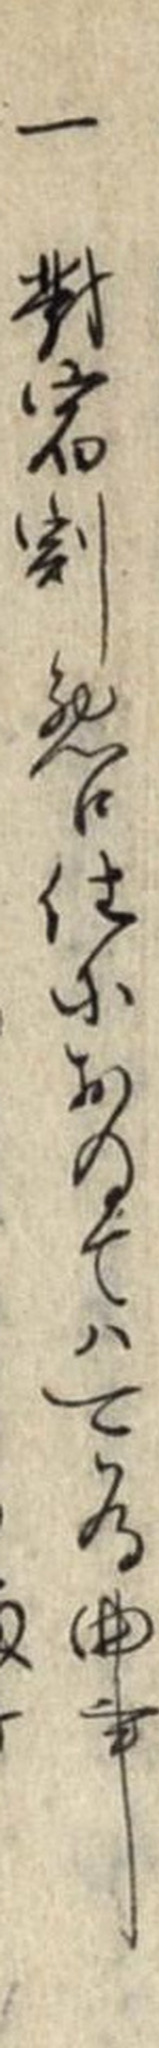一対宿割悪口仕におゐては可為曲事
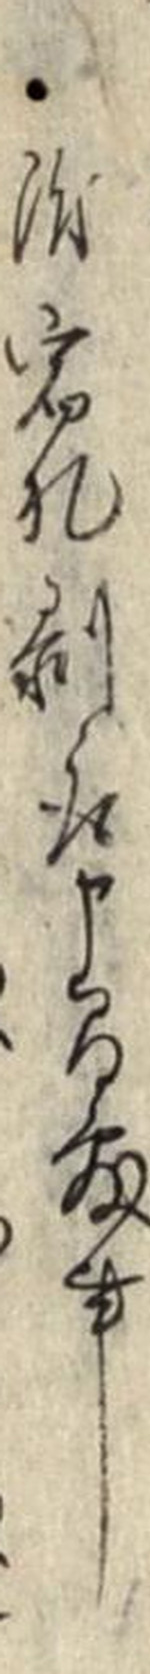附宿札剥取申間敷事
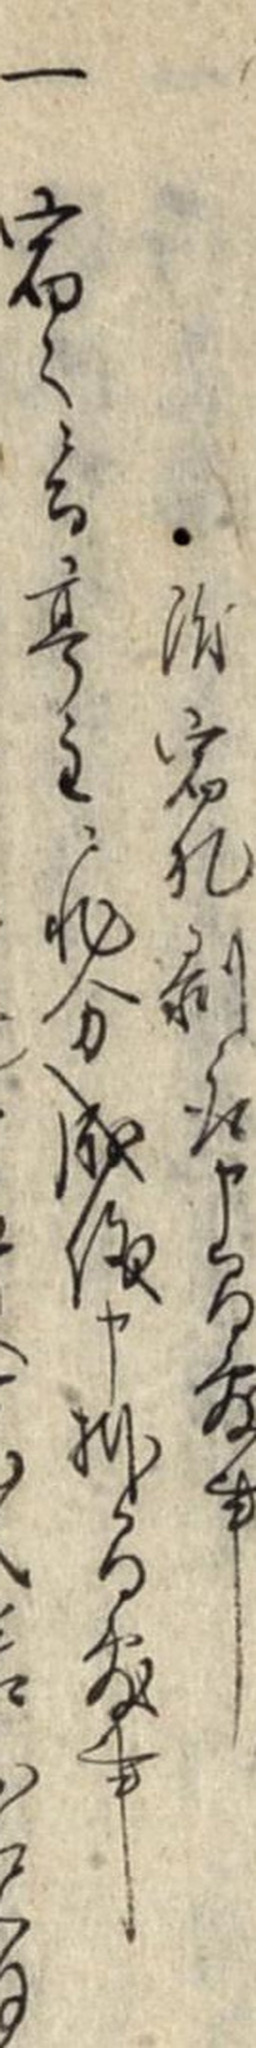一宿々にて亭主に非分成儀申掛間敷事
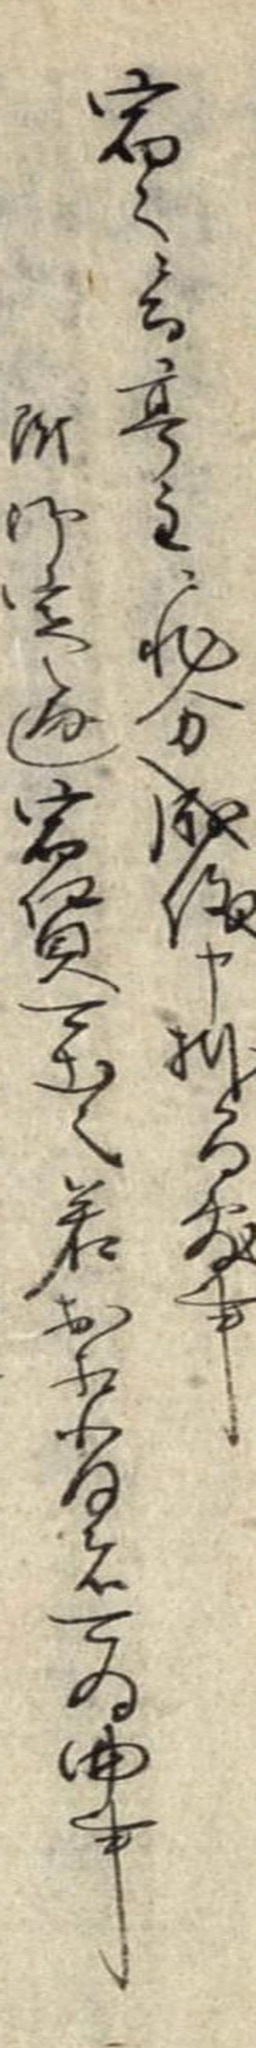附御定之通宿賃可出之若於相背は可為曲事
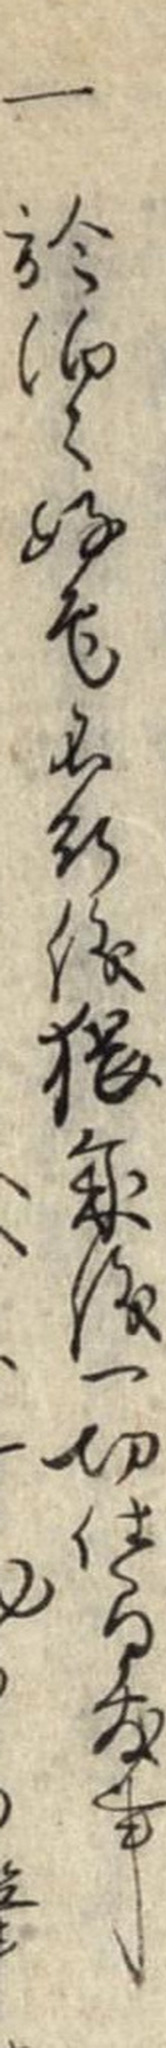一於泊々好色不行儀猥成儀一切仕間敷事
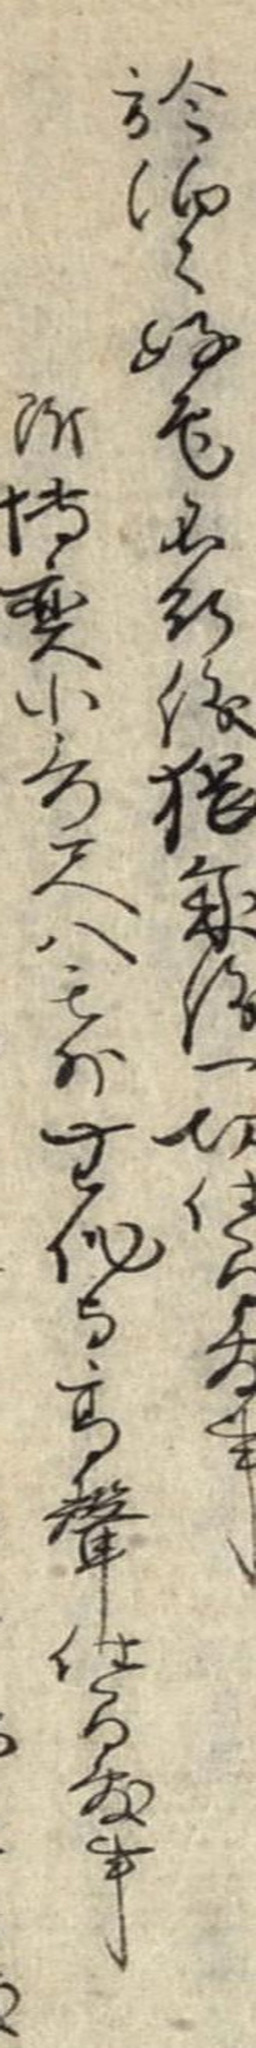附博奕小哥尺八其外無作と高声仕間敷事
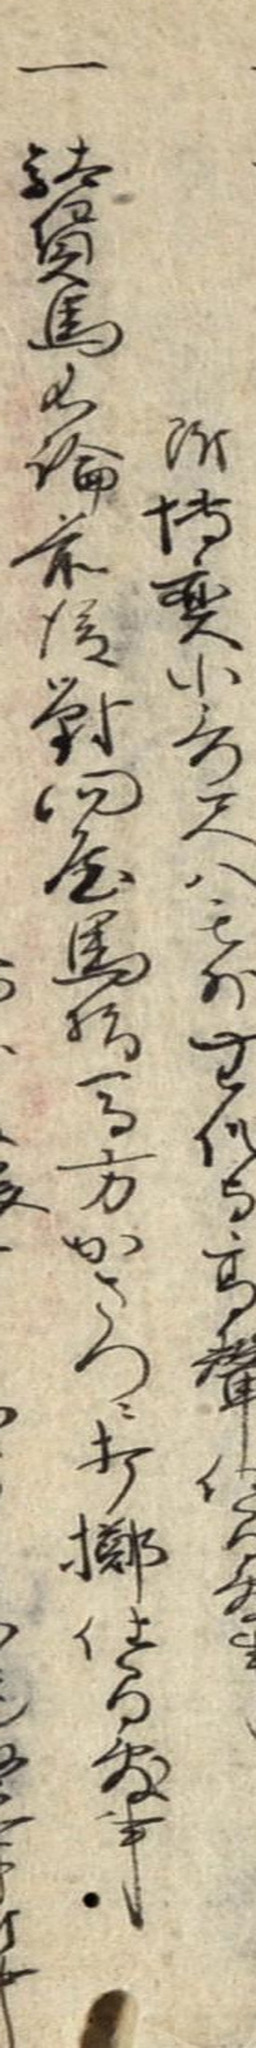一駄賃馬不論前後対問屋馬指馬方かさつに打擲仕間敷事
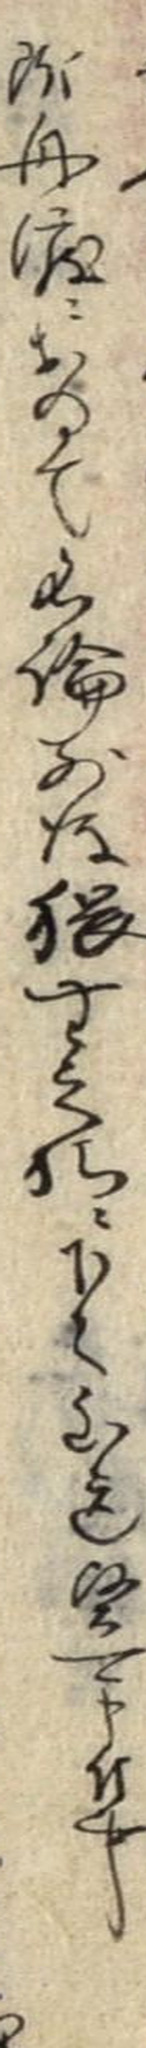附舟渡におゐて不論前後猥無之様に下々至迄堅可申付事
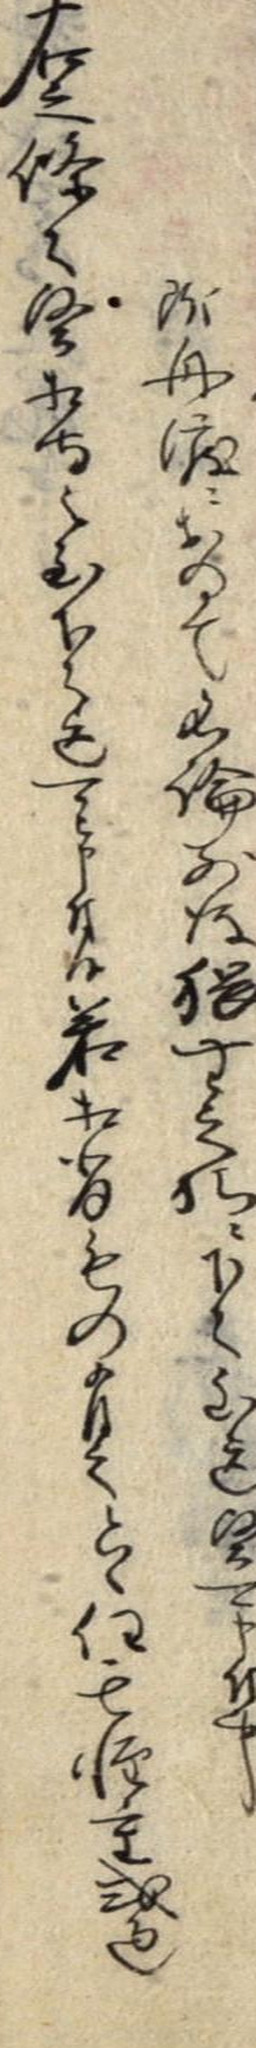右之条々堅相守之至下々迄可被申付候若於相背もの有之候はゝ任其軽重或過

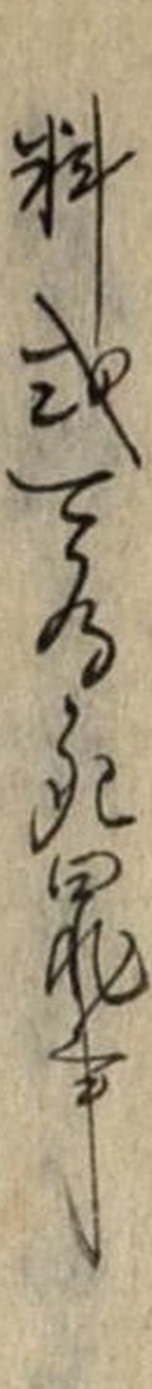料或可為死罪事
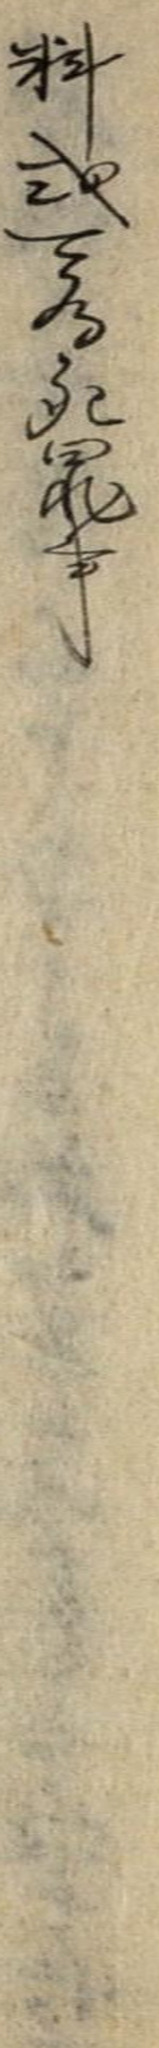料或可為死罪事
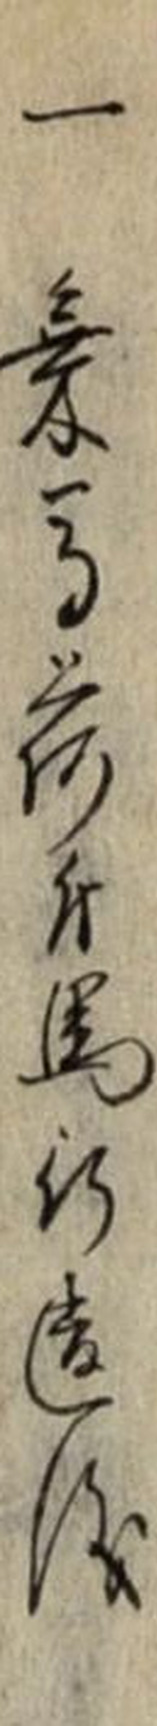一乗馬荷付馬行違儀
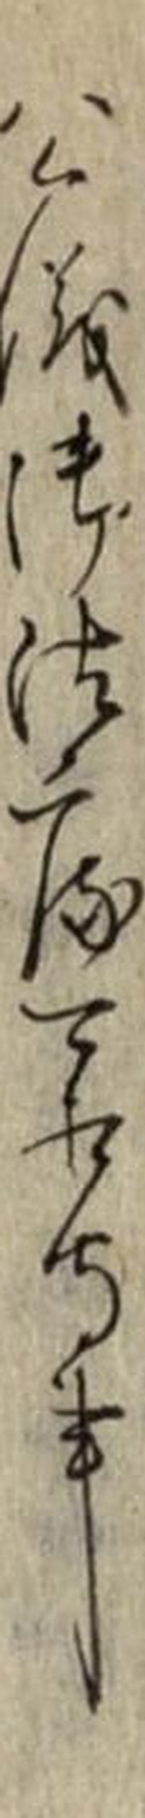公儀御法度可相守事
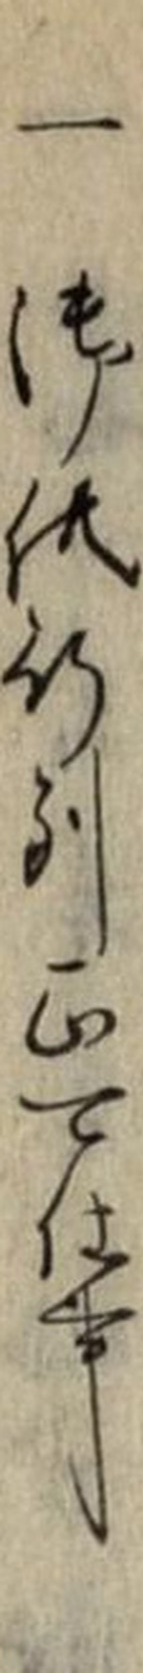一御供行列正可仕事
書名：三都并道中之部
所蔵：福井県文書館 Fukui Prefectural Archives
